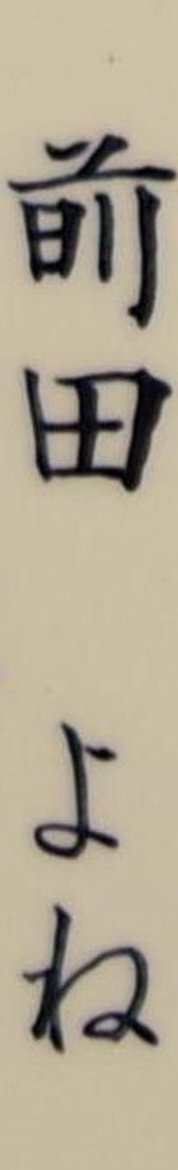前田よね
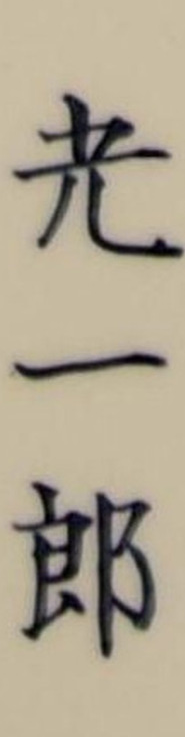光一郎
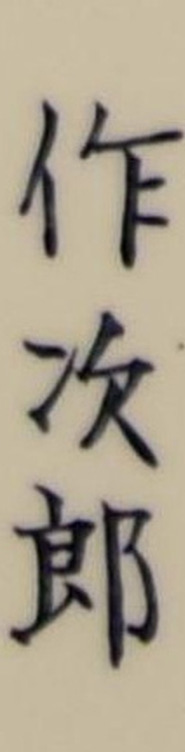作次郎
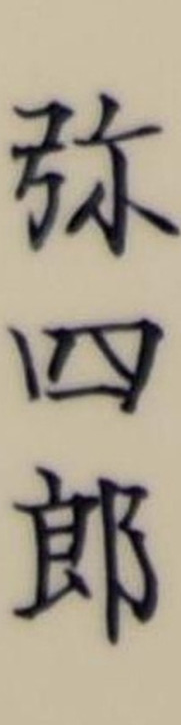弥四郎

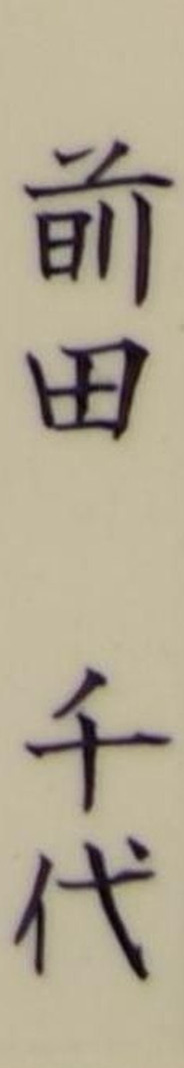前田千代
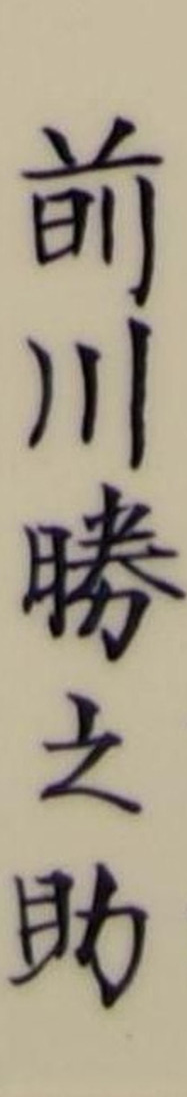前川勝之助
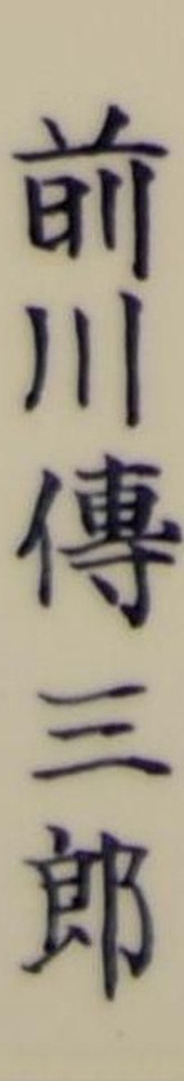前川傳三郎
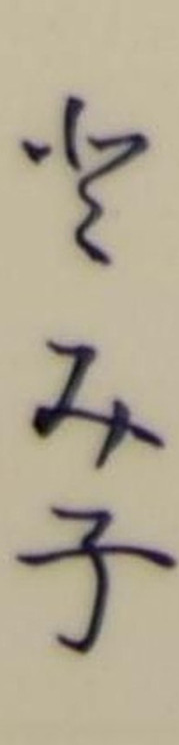とみ子
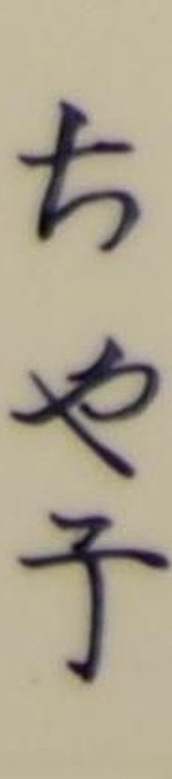ちや子
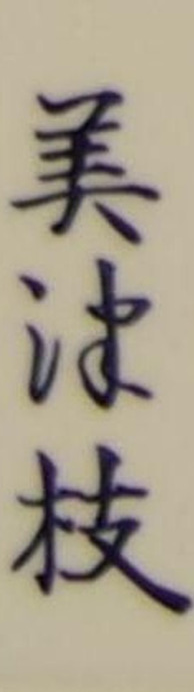美津枝
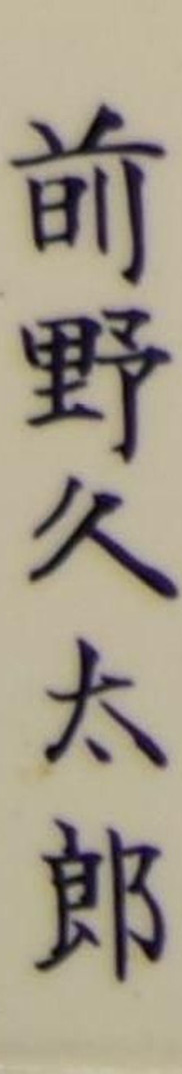前野久太郎

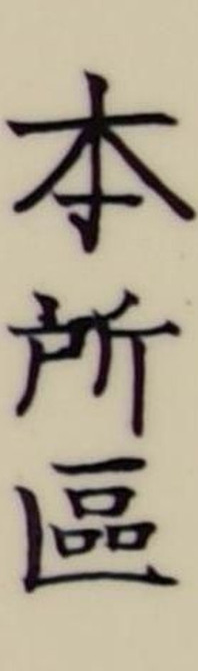本所区
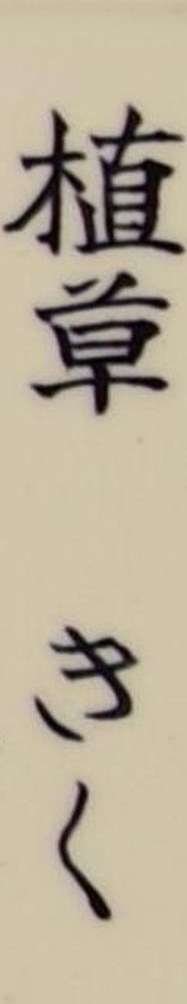植草きく
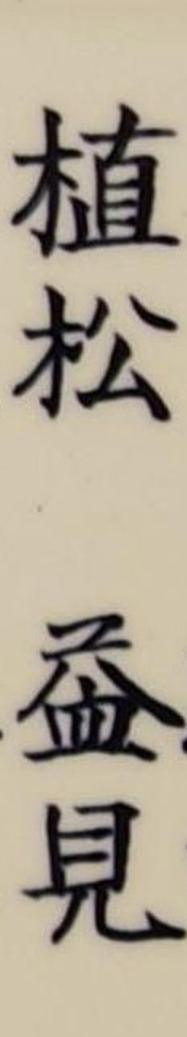植松益見
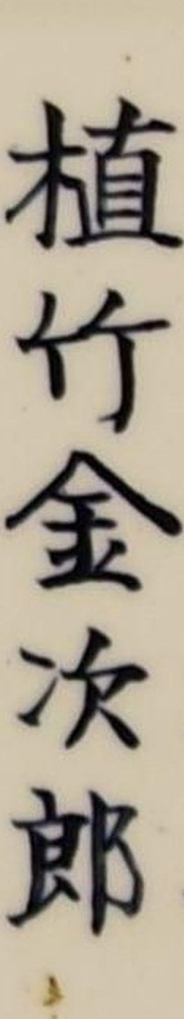植竹金次郎
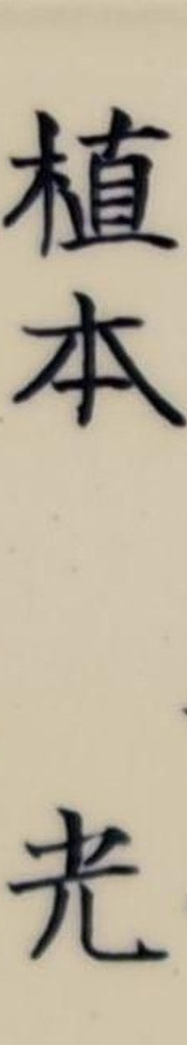植本光
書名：A~D
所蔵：koyasan kongobuji
